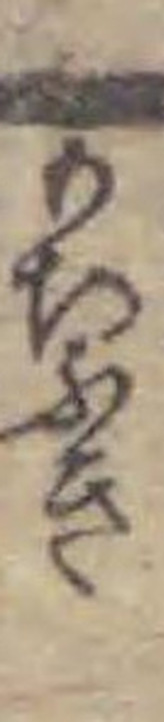もちふき
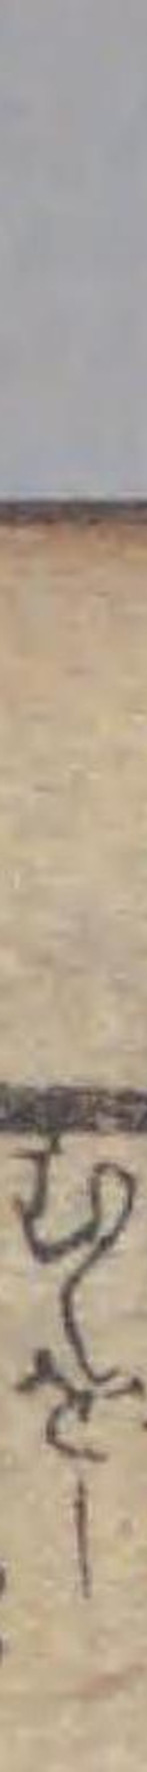むしをし
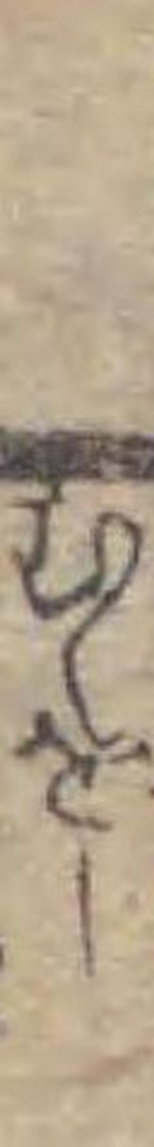むしをし
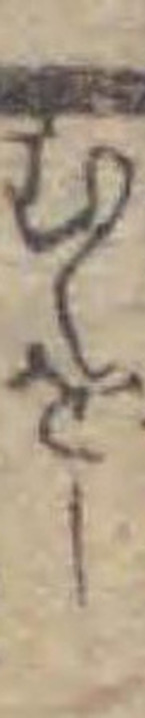むしをし
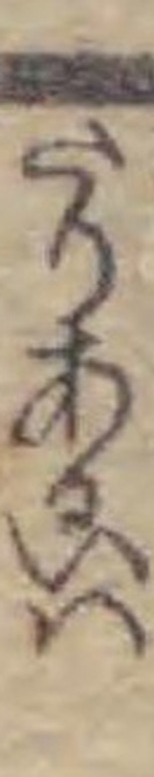たりあるいは
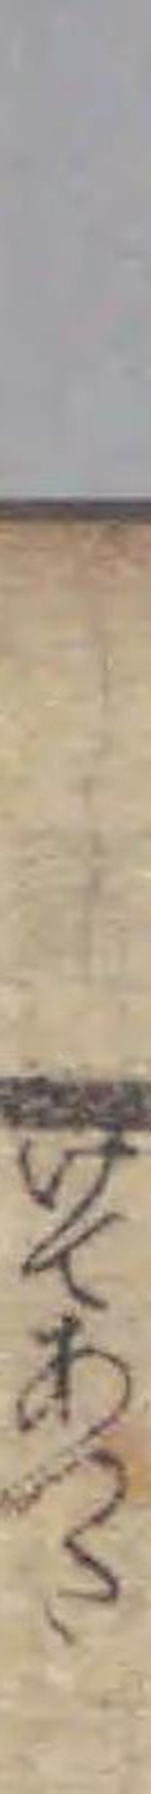けてあつた
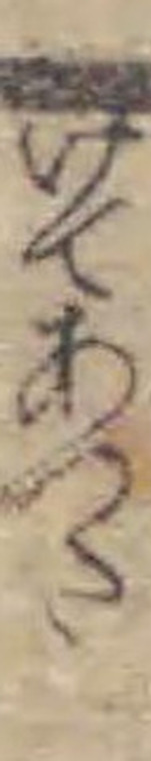けてあつた
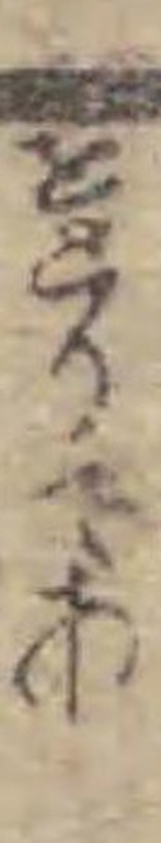をとりてあ
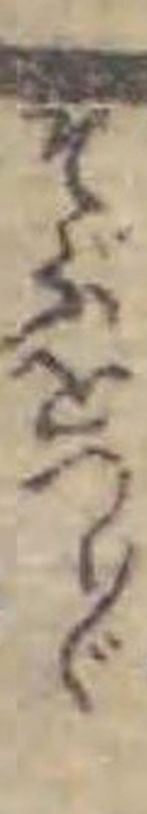そぶをつく〴〵
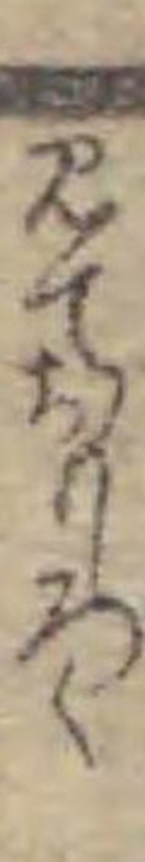見ておもしろく
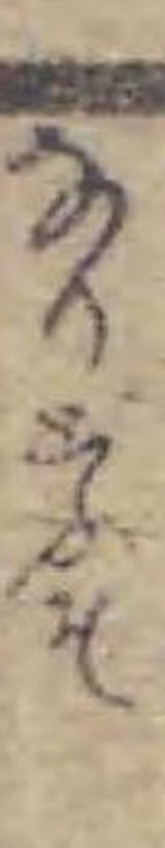なりどふぞ
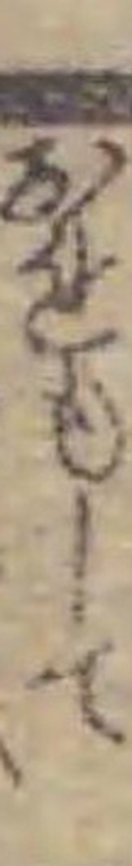おれもして
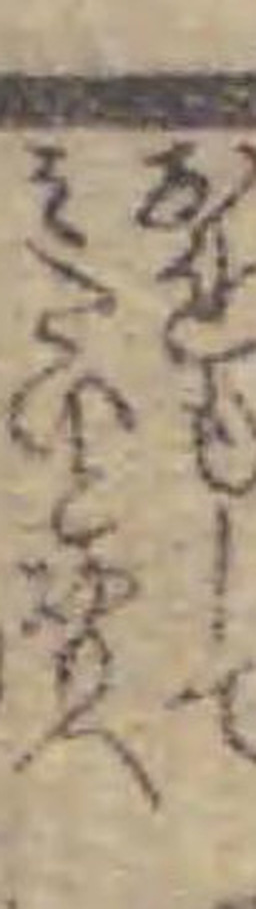みたいとおもへ
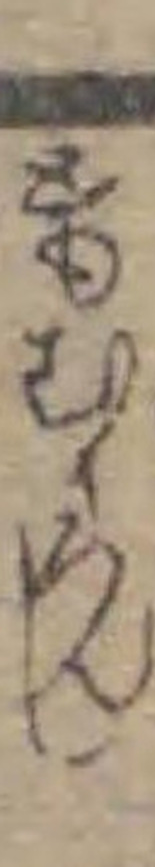ともむくろんし
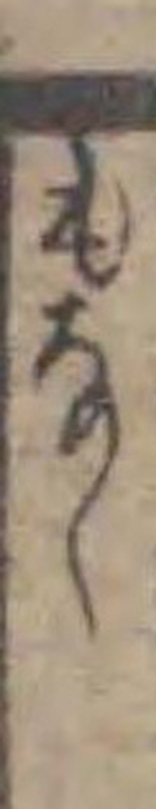もなく
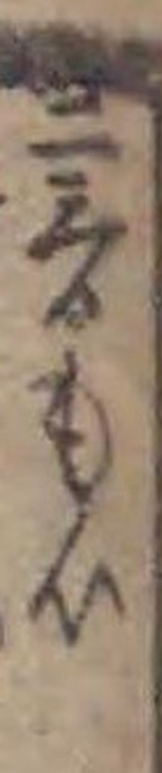二三日も心
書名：通風伊勢物語 : 3巻
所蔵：国立国会図書館 National Diet Library, JAPAN
